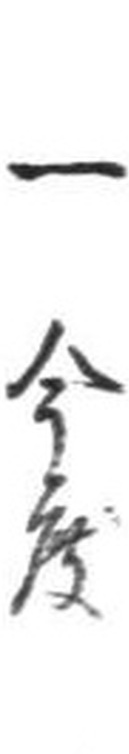一今度
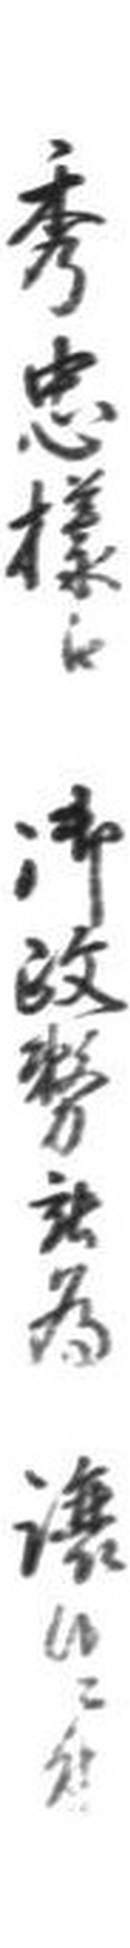秀忠様江御政務被為譲候ニ付

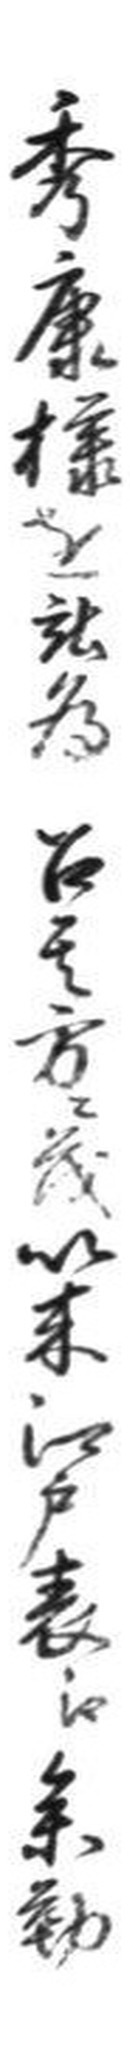秀康様を被為召其方ニも以来江戸表江参勤
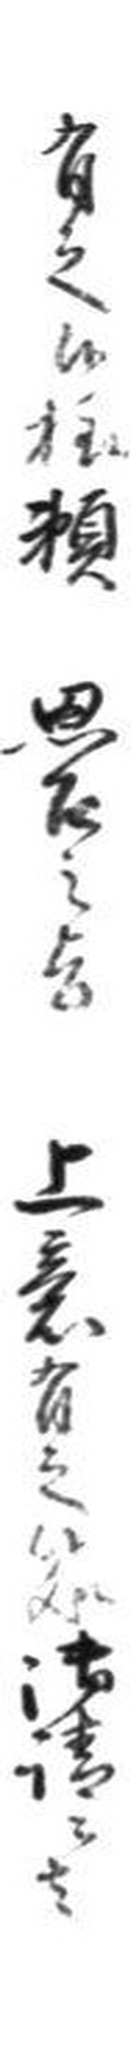有之候様頼思召之旨上意有之候処御請ニ者
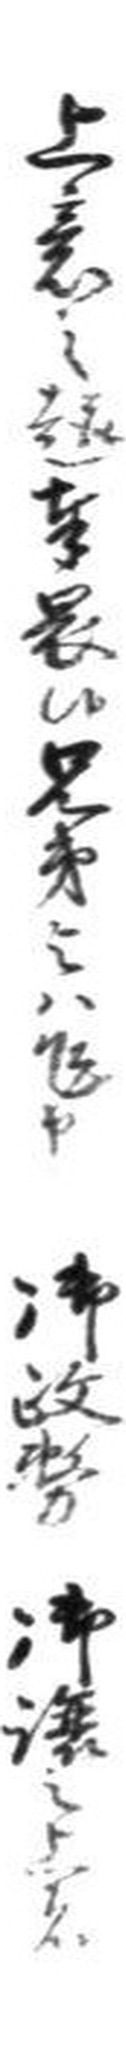上意之趣奉畏候兄弟とハ乍申御政務御譲之上者
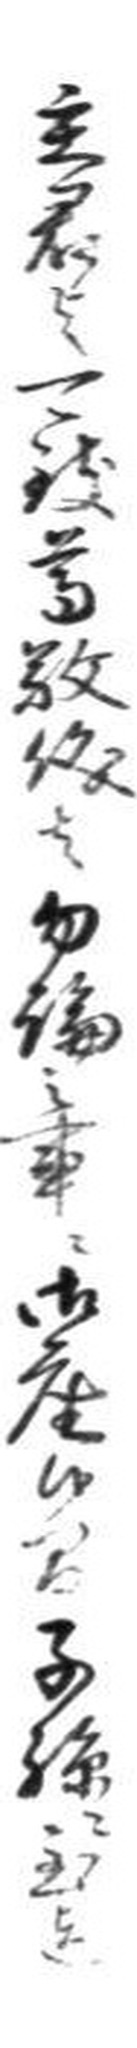主君と可致尊敬儀者勿論之事ニ御座候間子孫ニ至迄
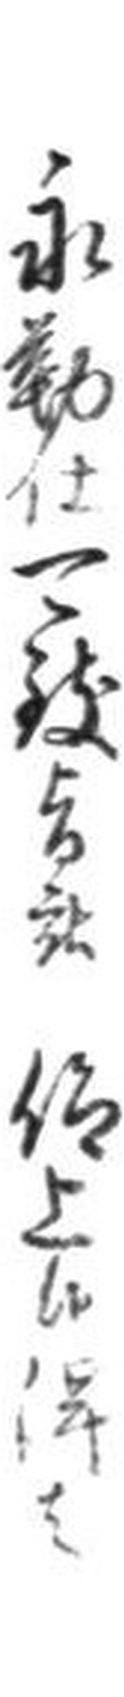永勤仕可致旨被仰上候得者
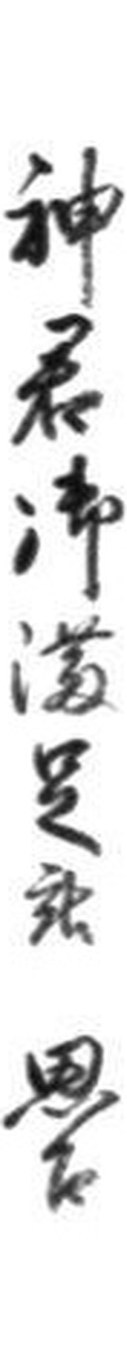神君御満足被思召
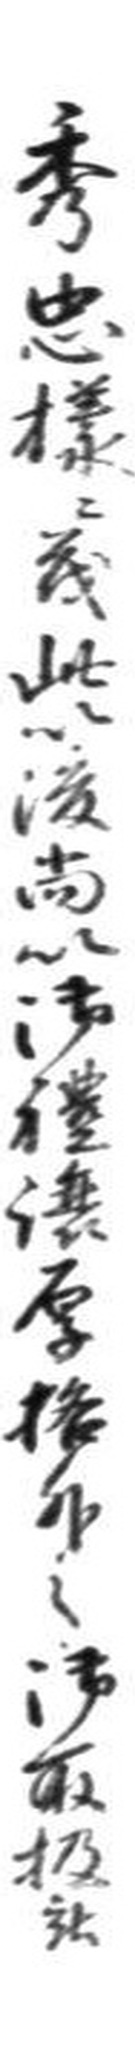秀忠様ニも此以後尚以御礼譲厚格外之御取扱被
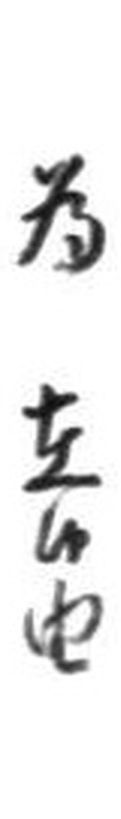為在候由
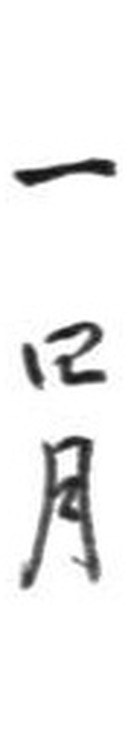一四月
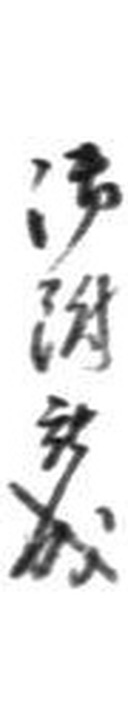御附被成
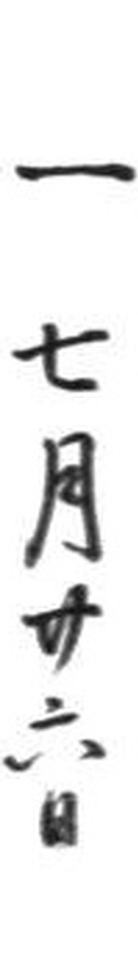一七月廿六日
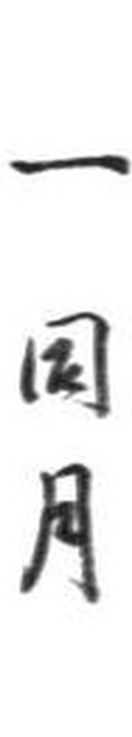一同月
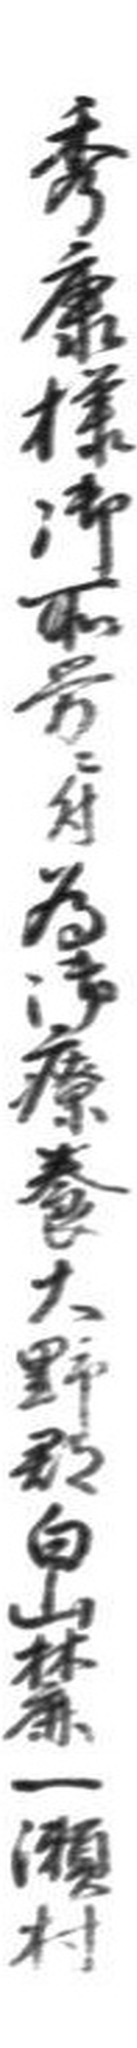秀康様御所労ニ付為御療養大野郡白山麓一瀬村
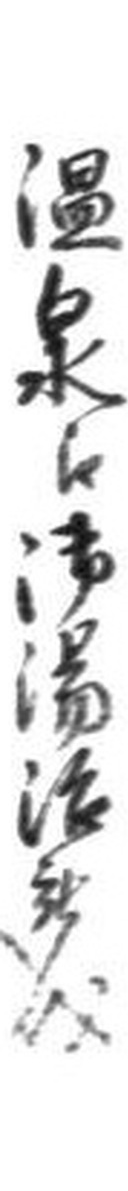温泉江御湯治被成
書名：家譜 一 秀康公 従天正二年到慶長十二年
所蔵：福井県文書館 Fukui Prefectural Archives
